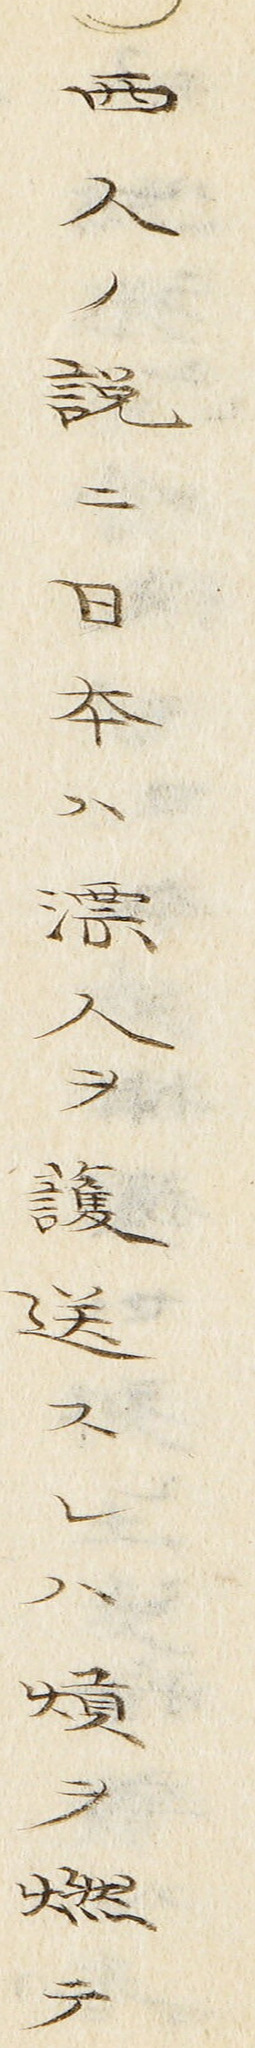〇西人ノ説ニ日本ハ漂人ヲ護送スレハ熕ヲ燃テ
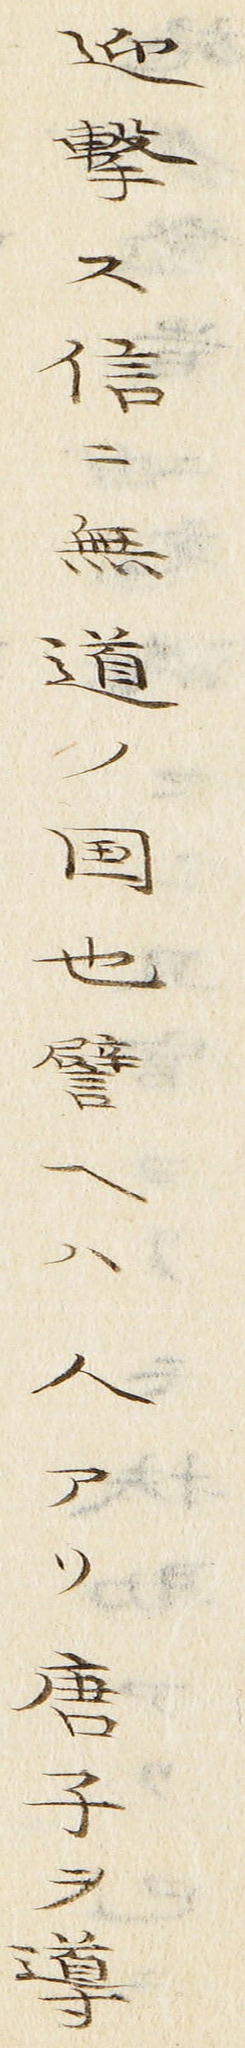迎撃ス信ニ無道ノ国也譬ヘハ人アリ唐子ヲ導
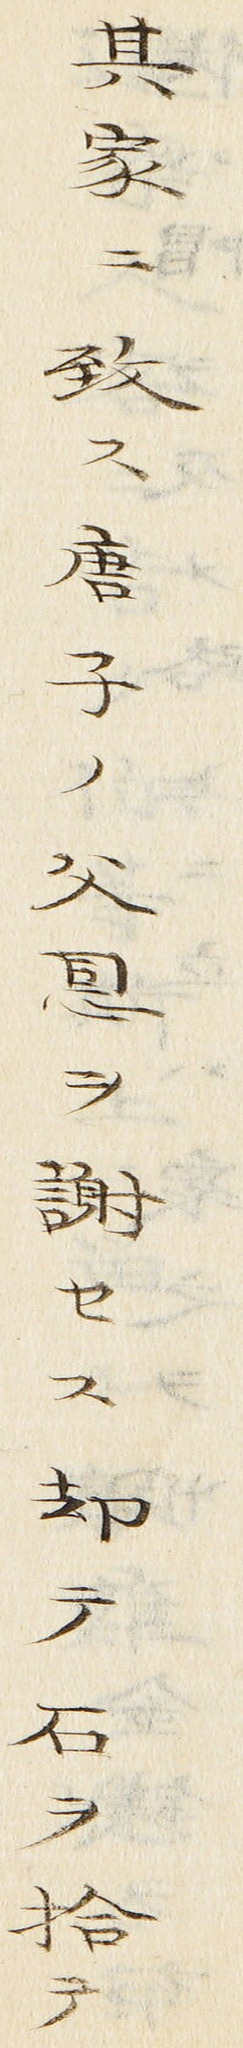其家ニ致ス唐子ノ父恩ヲ謝セス却テ石ヲ拾テ
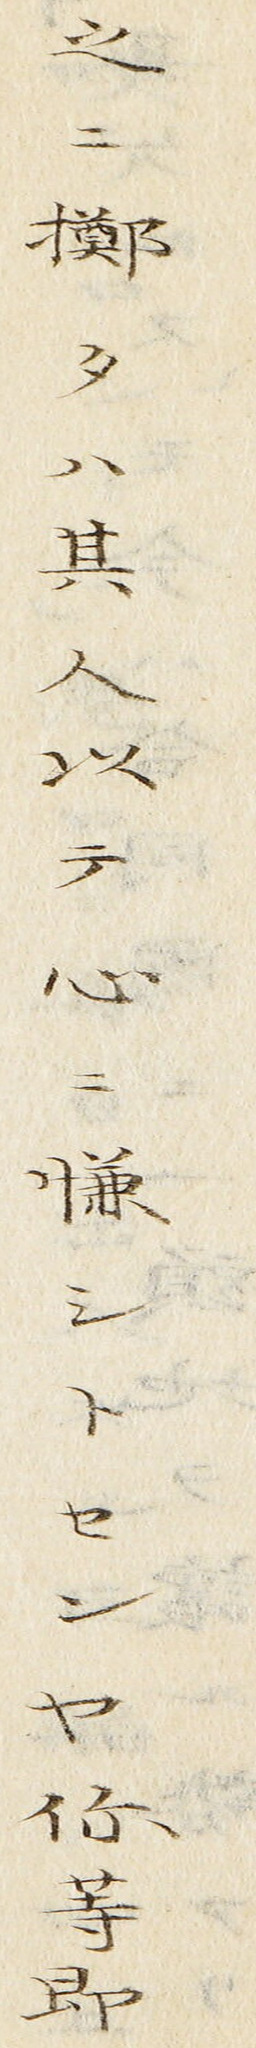之ニ擲タハ其人以テ心ニ慊シトセンヤ你等即
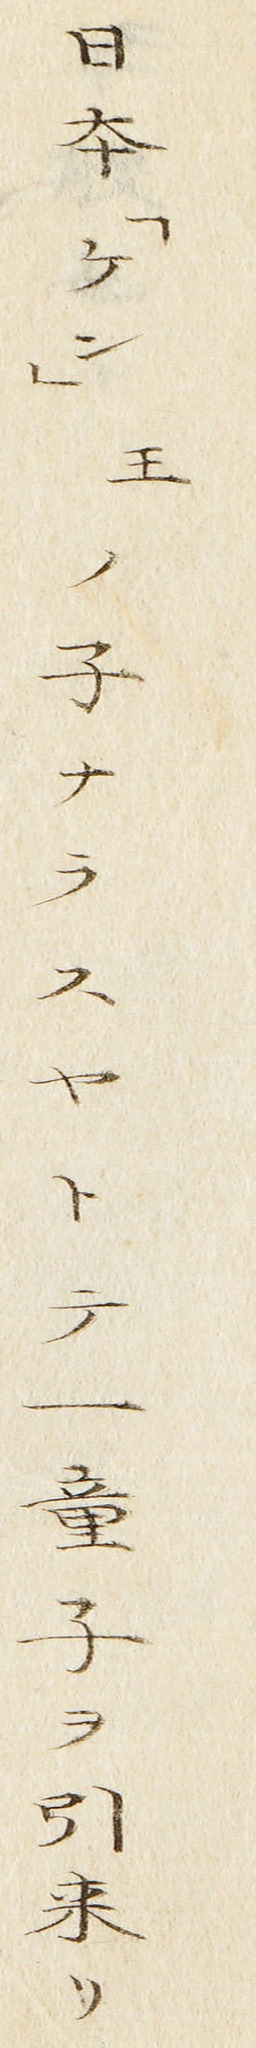日本「ケン」王ノ子ナラスヤトテ一童子ヲ引来リ
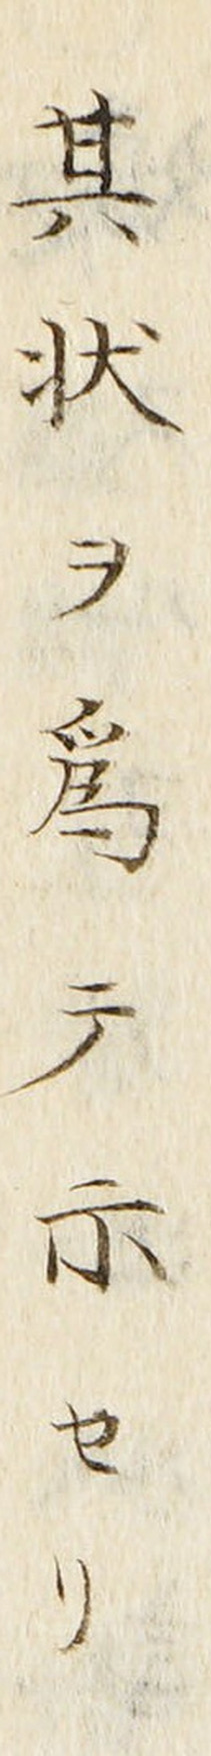其状ヲ為テ示セリ
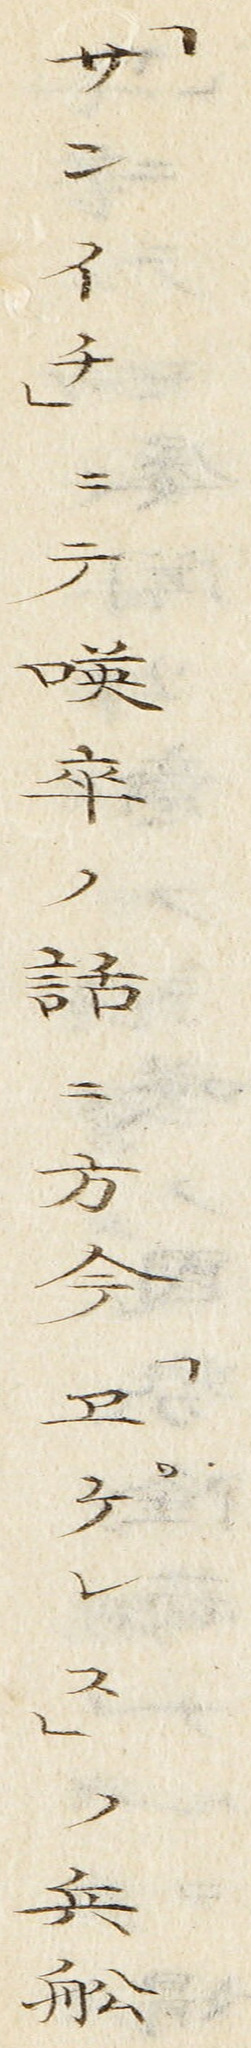〇「サンイチ」ニテ卒ノ話ニ方今「ヱゲレス」ノ兵舩
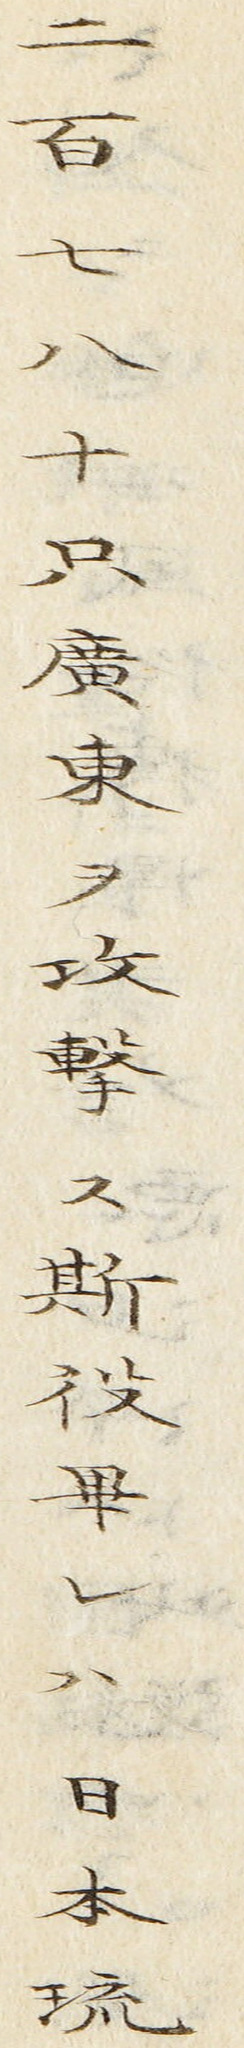二百七八十只廣東ヲ攻撃ス斯役畢レハ日本琉
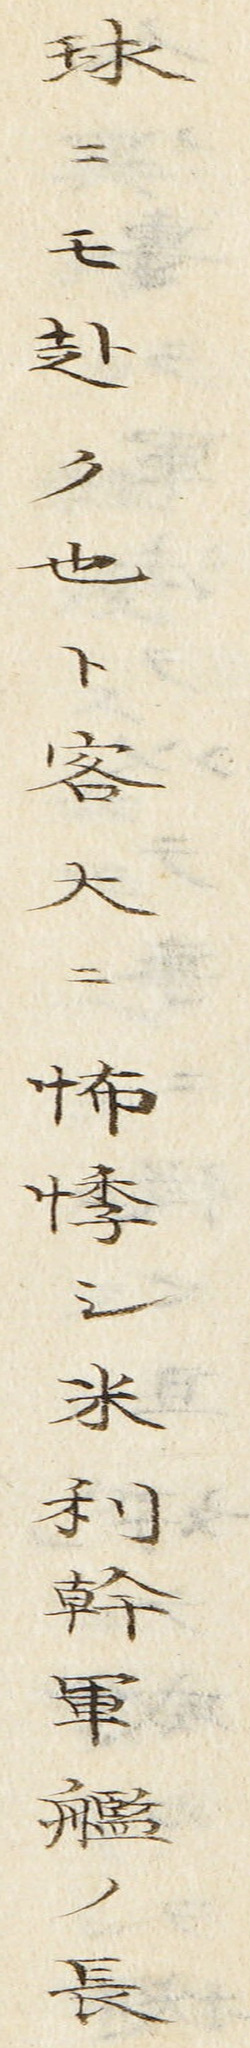球ニモ赴ク也ト客大ニ怖悸シ米利幹軍艦ノ長
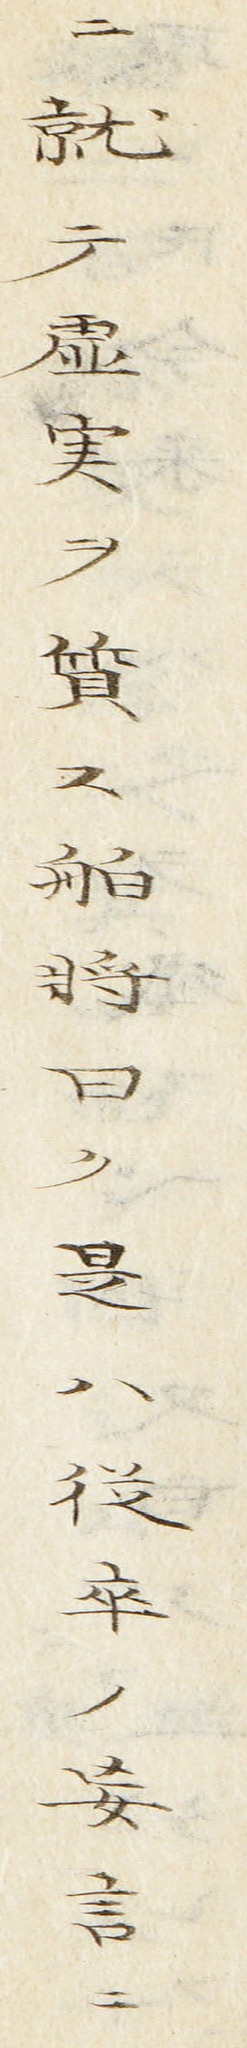ニ就テ虚実ヲ質ス舶将曰ク是ハ従卒ノ妄言ニ
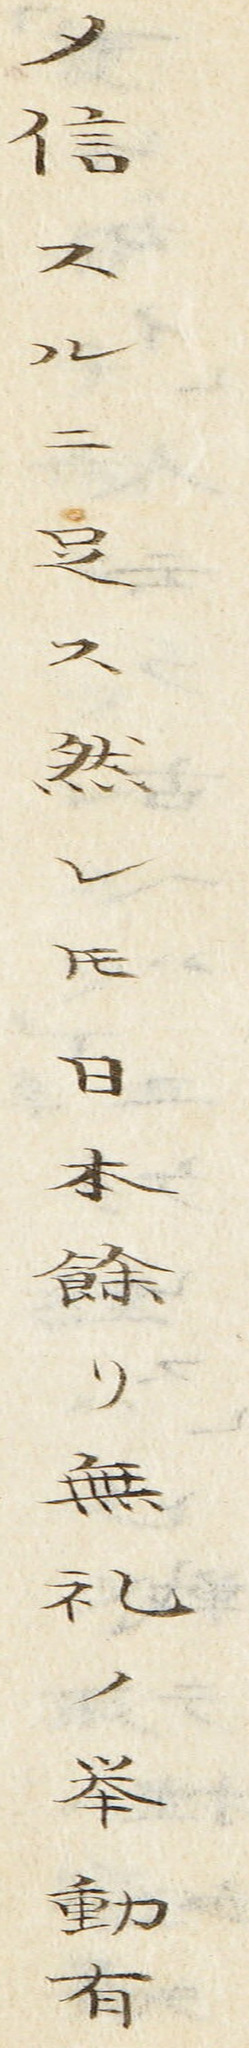シテ信スルニ足ス然レトモ日本餘リ無礼ノ挙動有
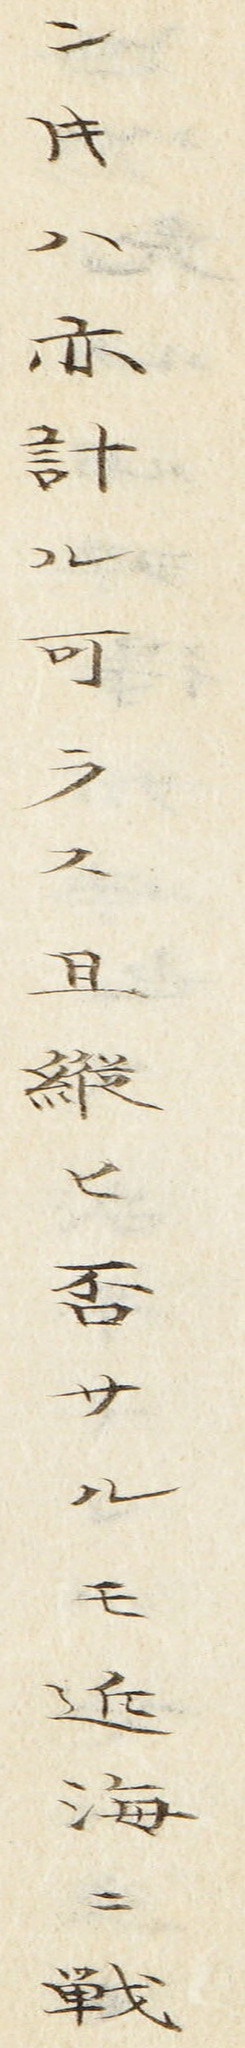ントキハ亦計ル可ラス且縦ヒ否サルモ近海ニ戦
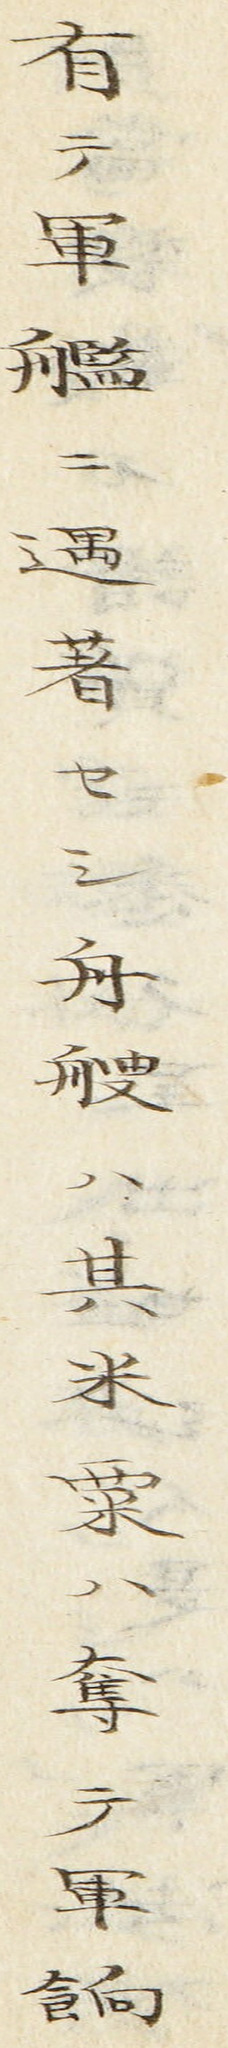有テ軍艦ニ遇著セシ舟艘ハ其米粟ハ奪テ軍餉

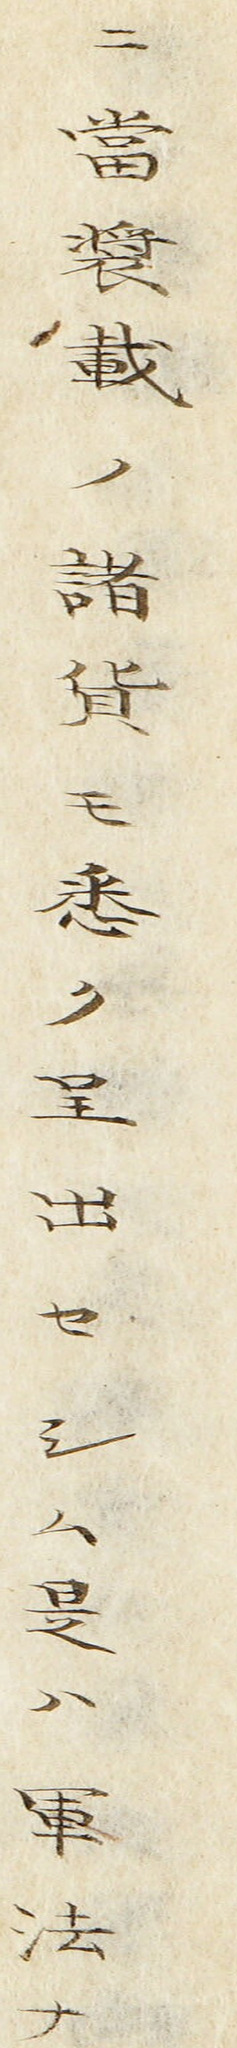ニ當載ノ諸貨モ悉ク呈出セシム是ハ軍法ナ
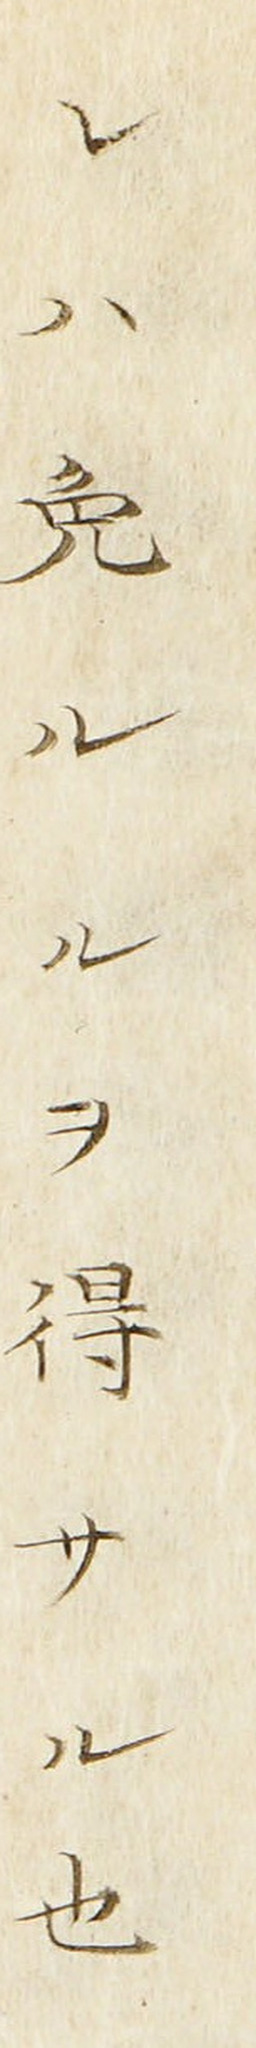レハ免ルルヲ得サル也
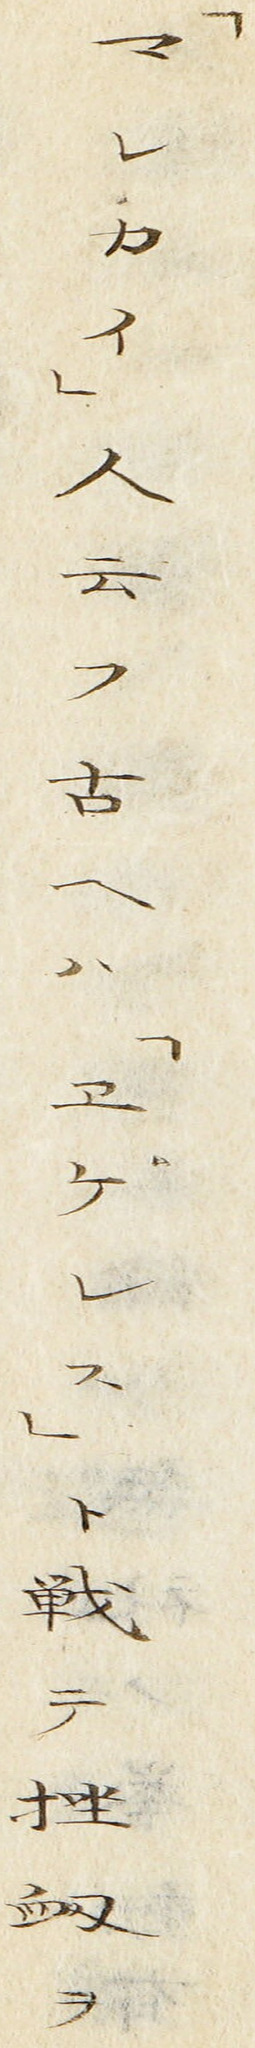〇「マレカイ」人云フ古ヘハ「ヱゲレス」ト戦テ挫衂ヲ
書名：蕃談
